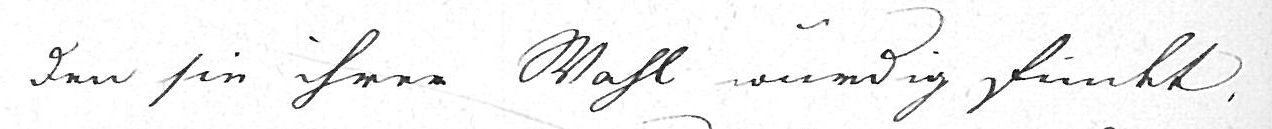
den sie ihrer Wahl würdig findet,
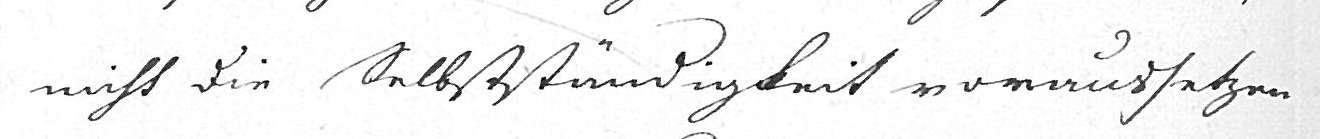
nicht die Selbstständigkeit vorausetzen
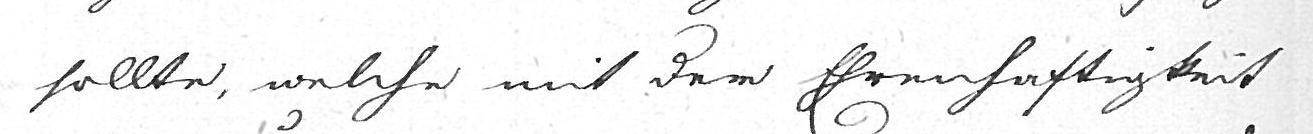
sollte, welche mit der Ehrenhaftigkeit
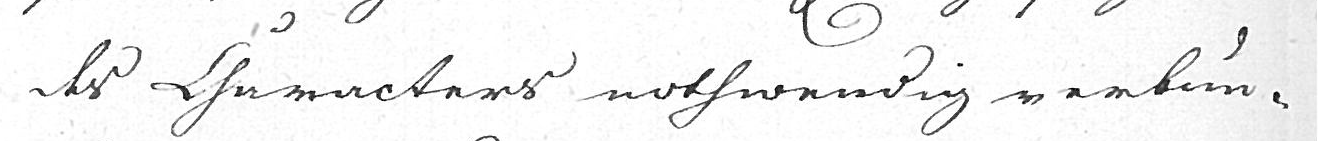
des Characters nothwendig verbun-
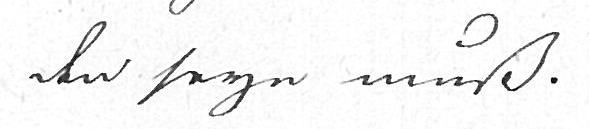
den seyn muß.
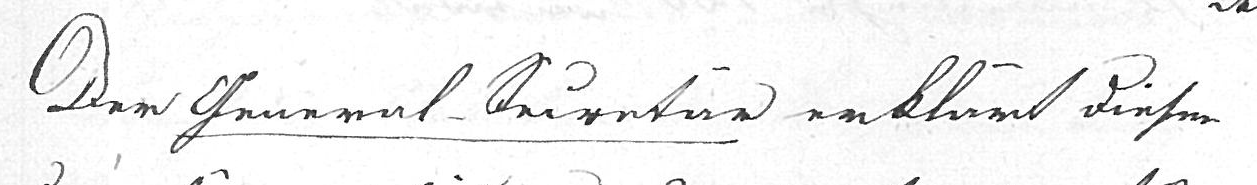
Der General-Secretär erklärt diesen
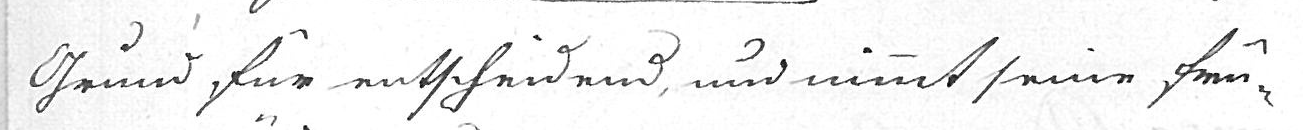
Grund für entscheidend, und nimmt seine frü-
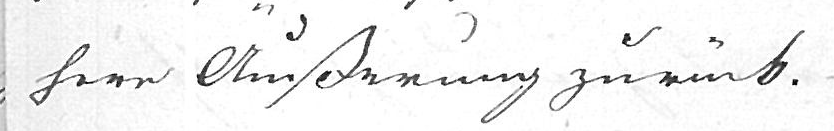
here Äußerung zurück.
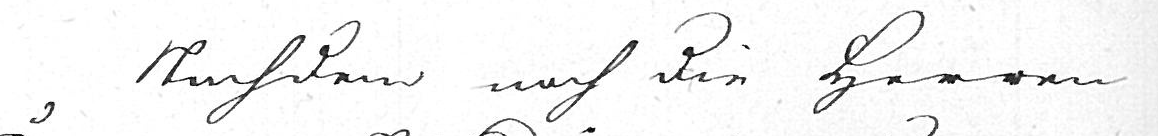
Nachdem noch die Herren
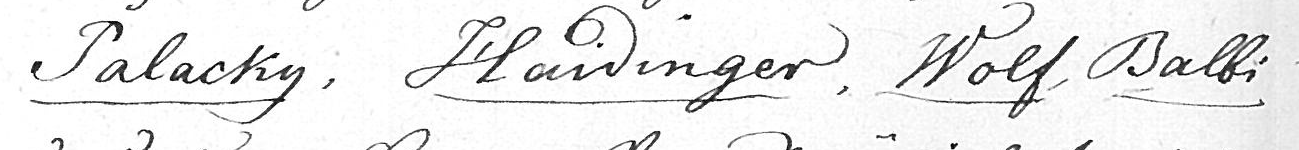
Palacky, Haidinger, Wolf, Balbi
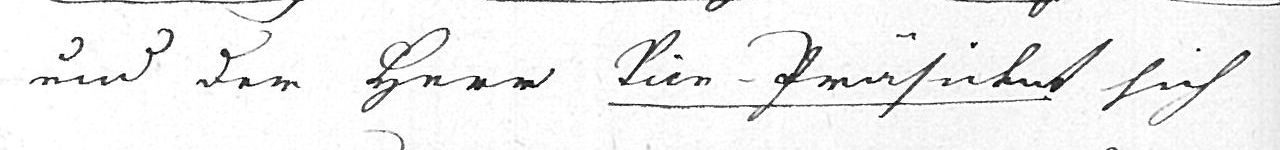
und der Herr Vice-Präsident sich
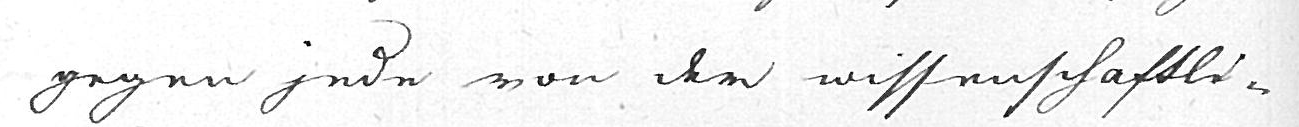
gegen jede von der wissenschaftli-
